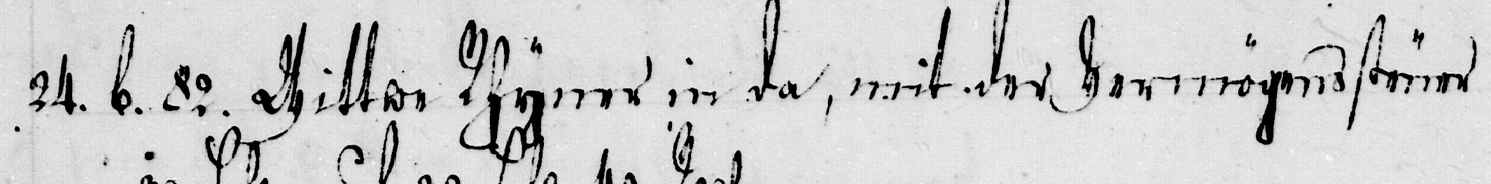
24. b. 82. Wittwe Rhyner in da, mit der Vermögenssteuer
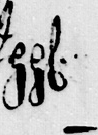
20.
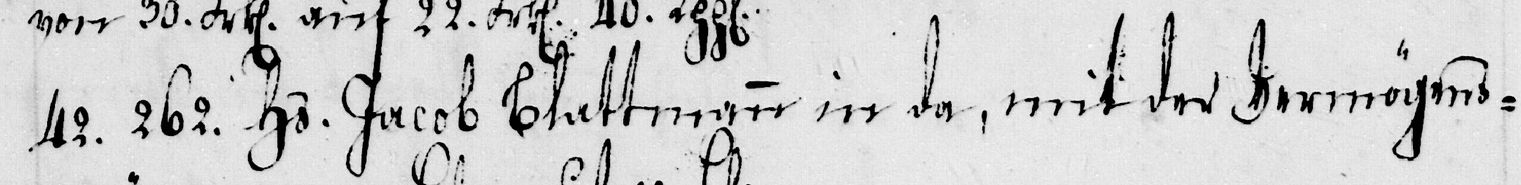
42. 262. Hs. Jacob Blattmann in da, mit der Vermögens¬
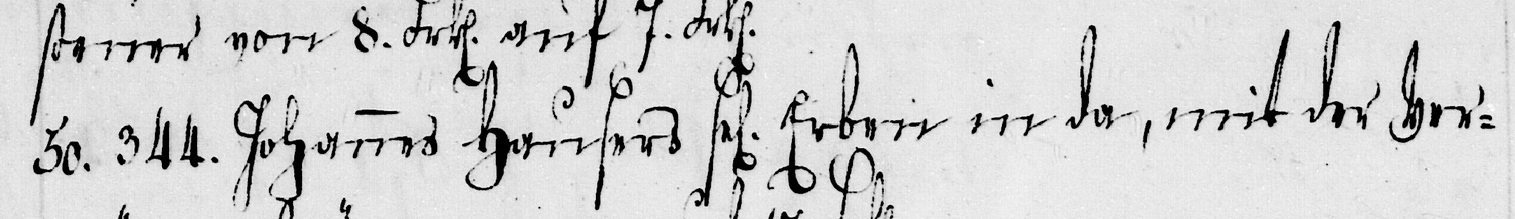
50. 344. Johannes Hausers sel[igen] Erben in da, mit der Ver¬
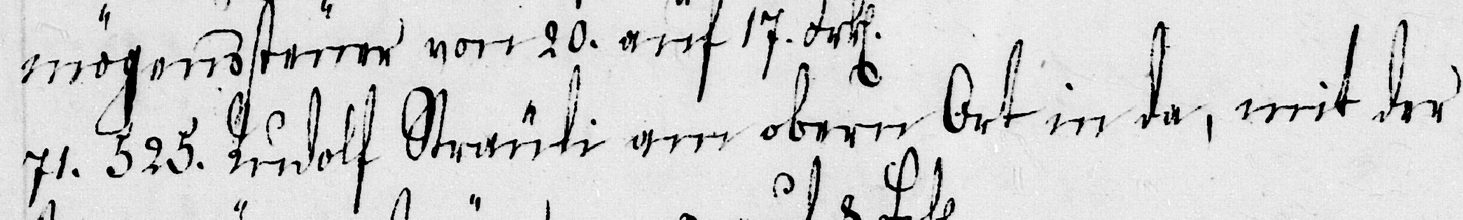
71. .525. Rudolf Sträuli am obern Ort in da, mit der
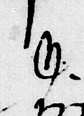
1.
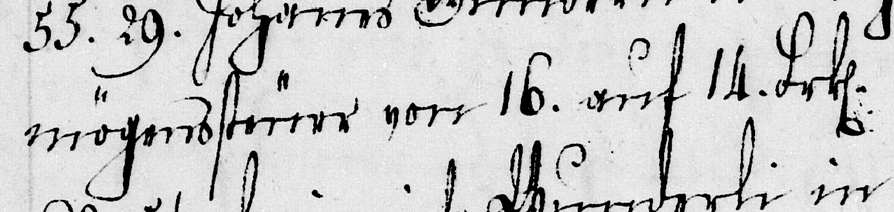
mögenssteuer von 16. auf 14. Frk[e¬
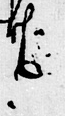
26.
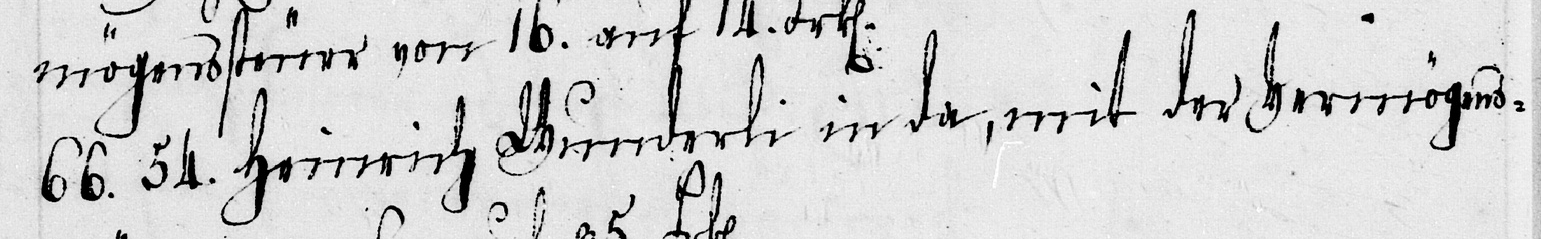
66. 54. Heinrich Wunderli in da, mit der Vermögens¬
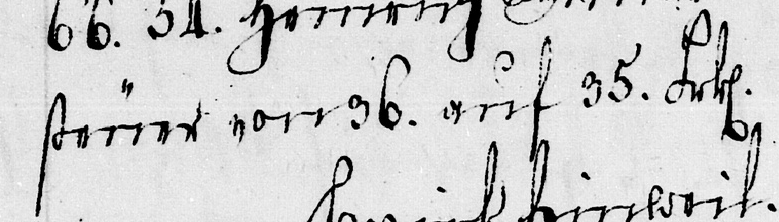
steuer von 36. auf 35. Frk[e¬
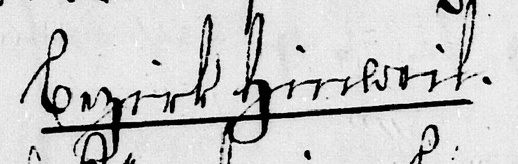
Bezirk Hinweil.
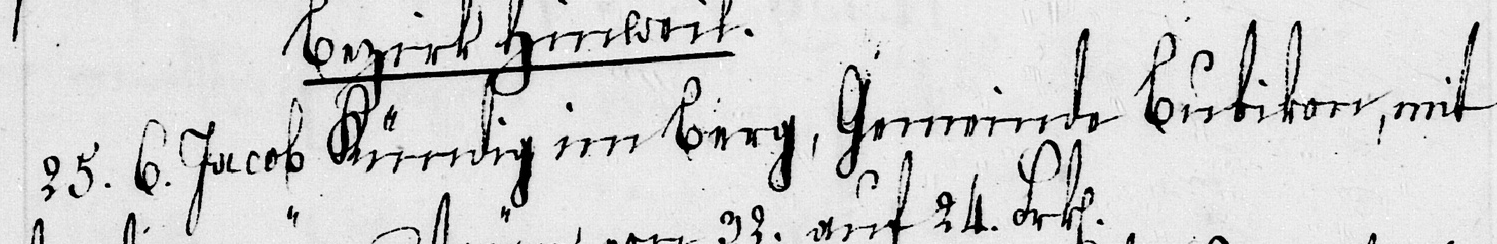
25. 6. Jacob Kündig im Berg, Gemeinde Bubikon, mit
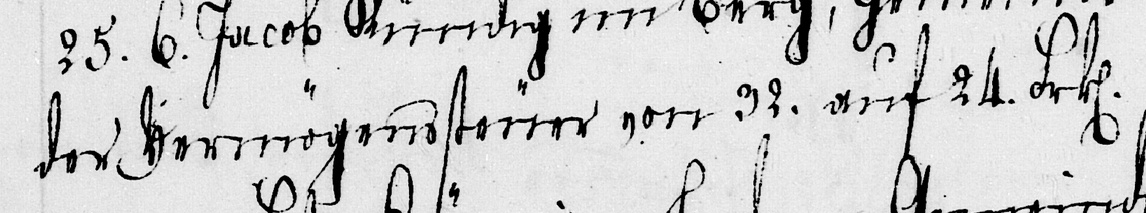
der Vermögenssteuer von 32. auf 24. Frk[e¬
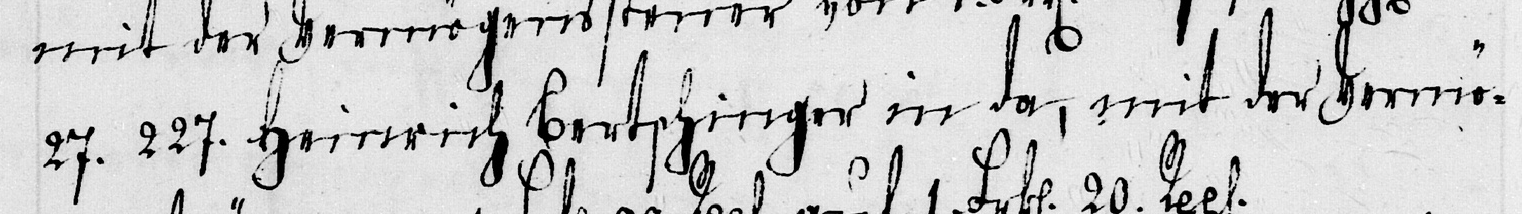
27. 227. Heinrich Bertschinger in da, mit der Vermö¬
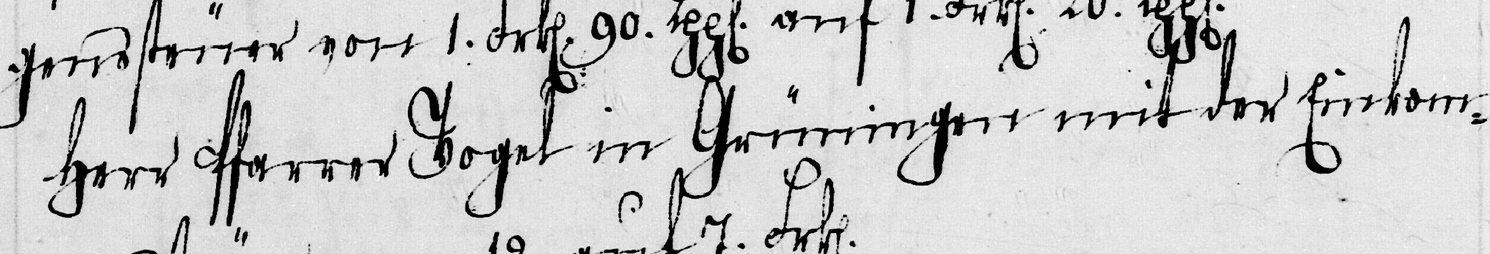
Herr Pfarrer Vogel in Grüningen mit der Einkom¬
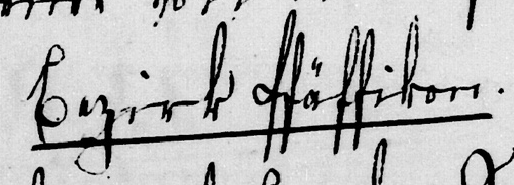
Bezirk Pfäffikon.
